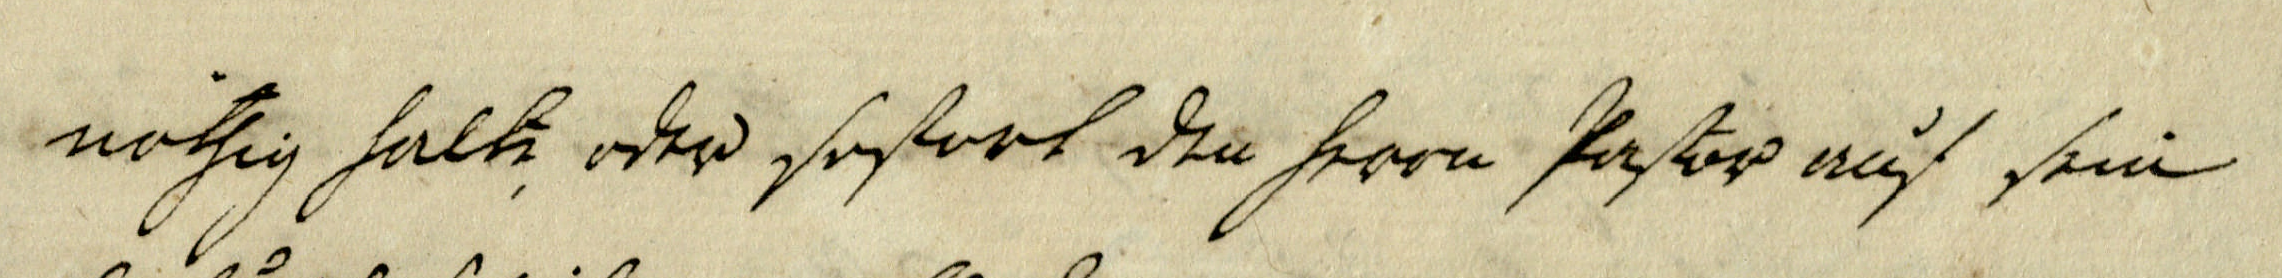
nöthig halte, oder sofort den Herrn Pastor auf sein
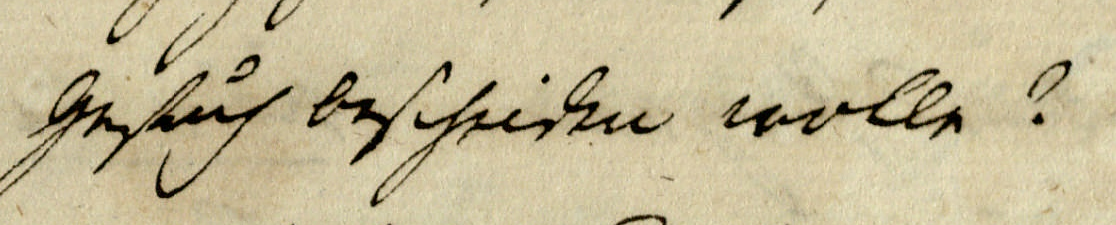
Gesuch bescheiden wolle?
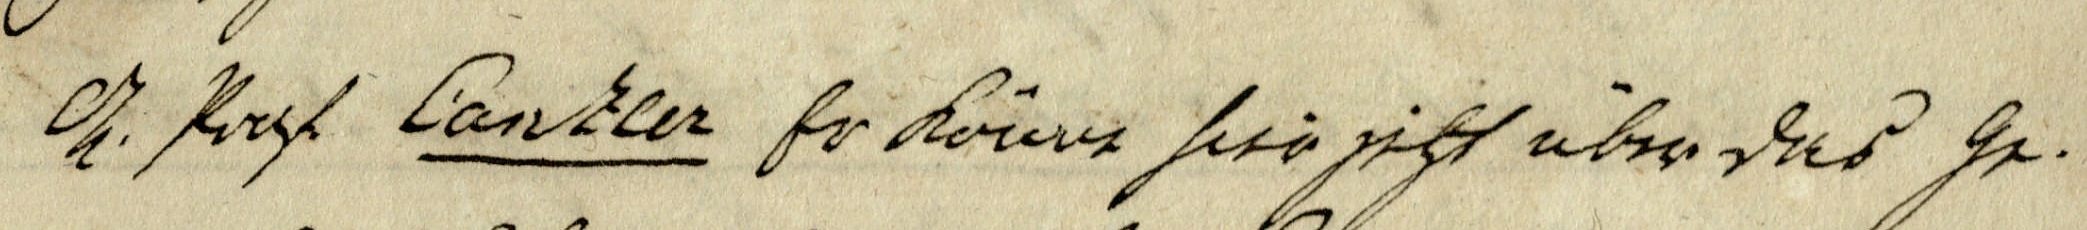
dh. Prof. Canzler Er könne hier jetzt über das Ge¬
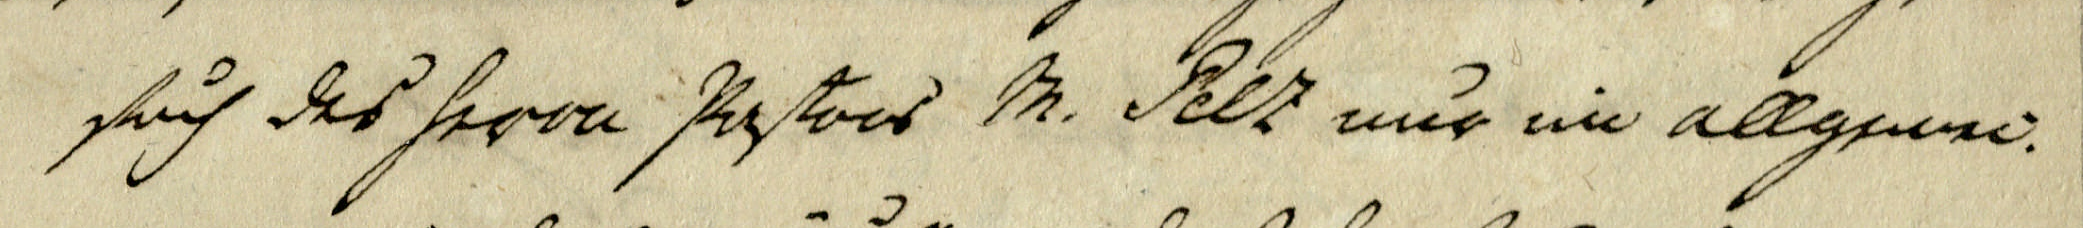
such des Herrn Pastors M. Pelz nur im allgemei¬
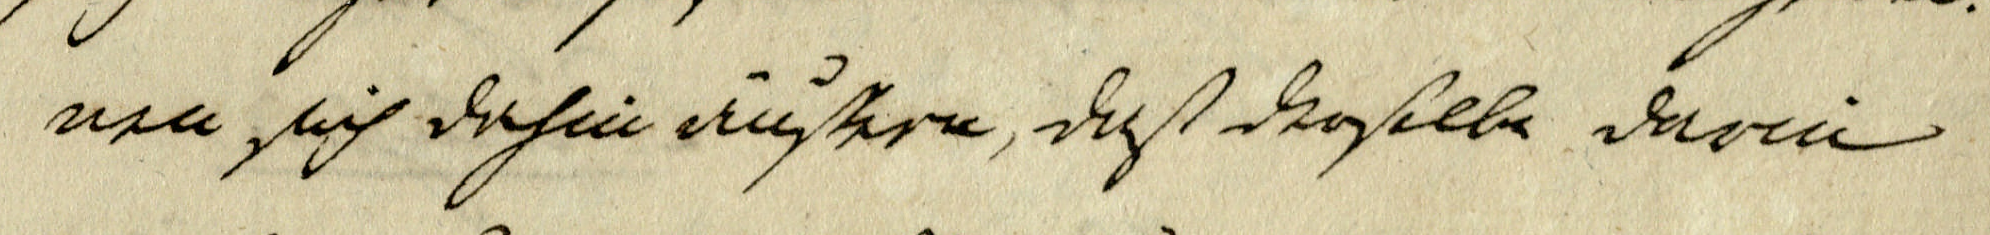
nen sich dahin äussern, daß derselbe darin
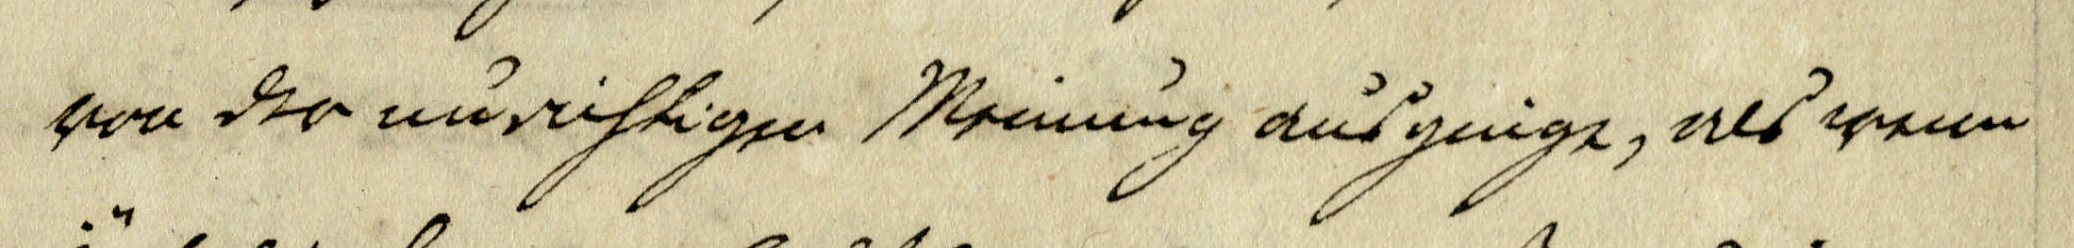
von der unrichtigen Meinung ausginge, als wenn
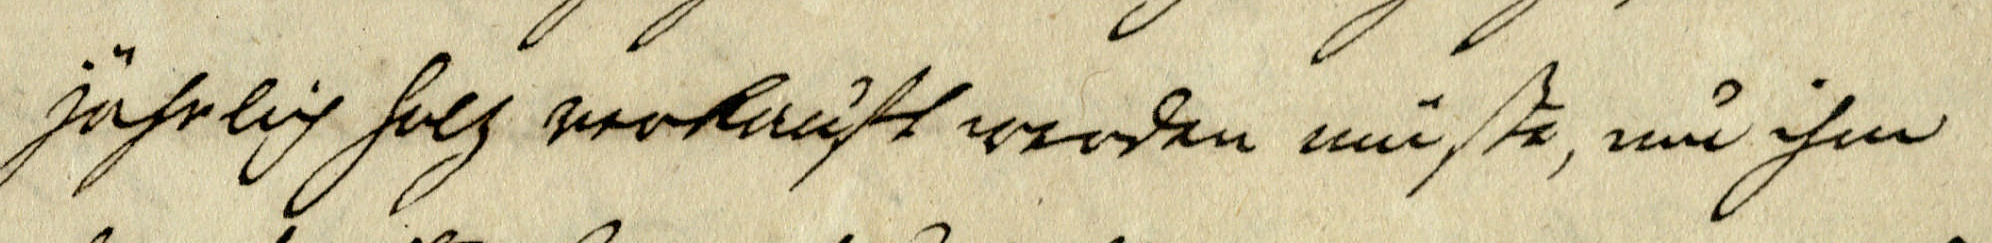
jährlich Holz verkauft werden müßte, um ihm
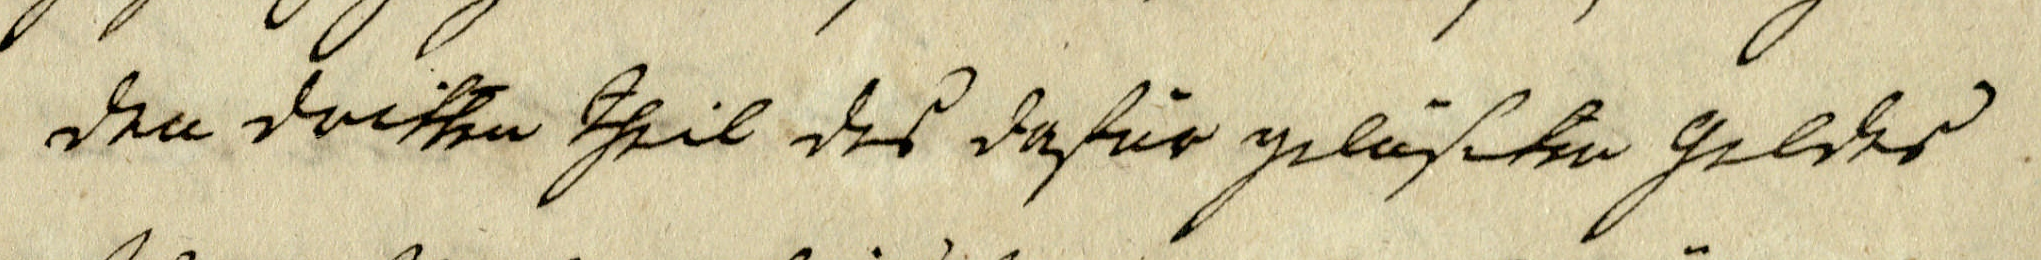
den dritten Theil des dafür gelösten Geldes
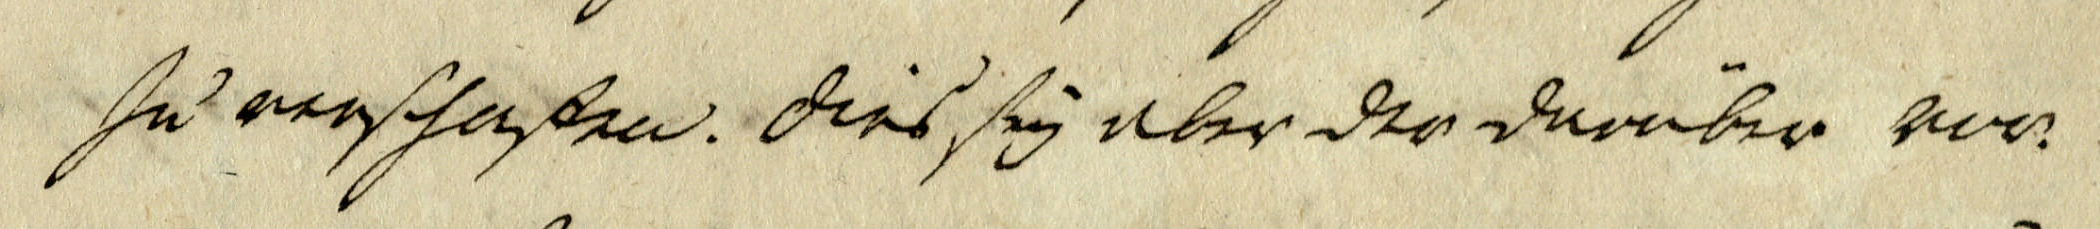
zu verschaffen. Dies seÿ aber der darüber vor¬
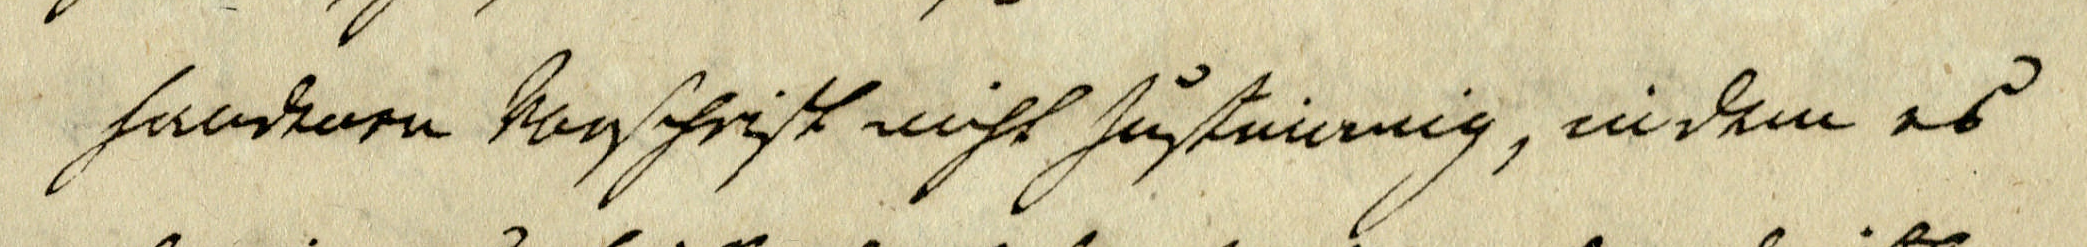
handenen Vorschrift nicht zustimmig, in dem es
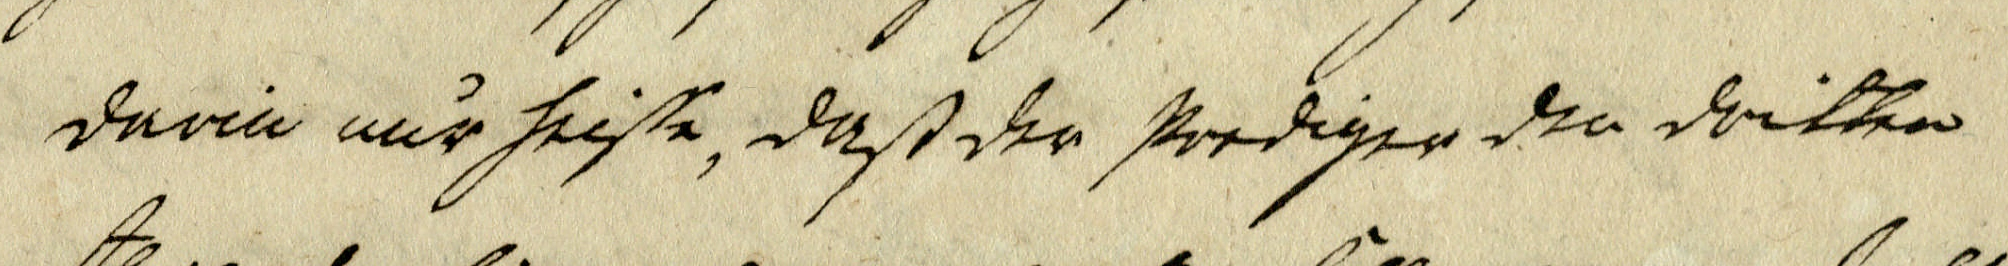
darin nur heisse, daß der Prediger den dritten
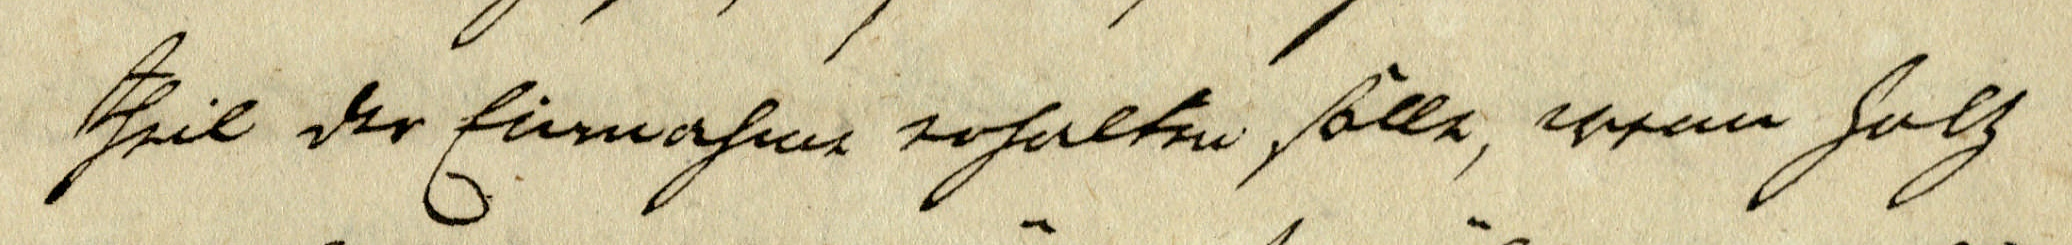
Theil der Einnahme erhalten solle, wenn Holz
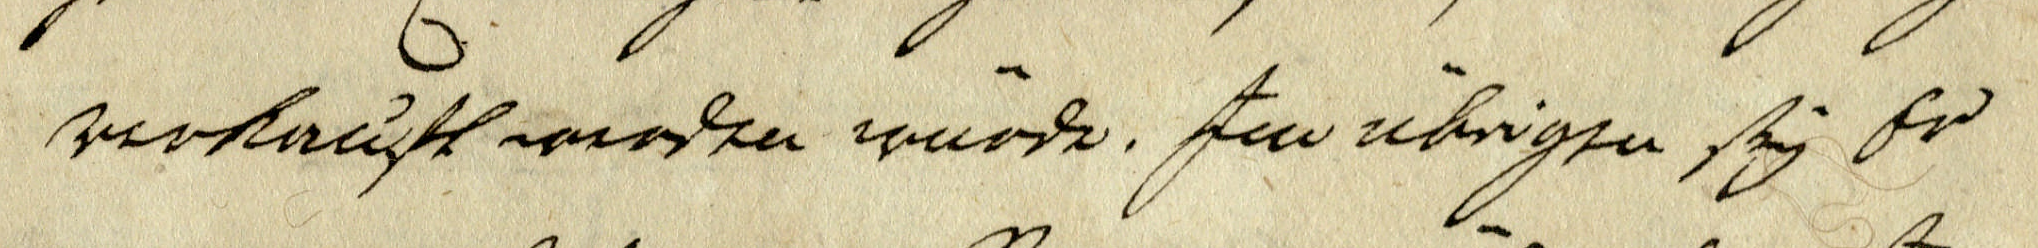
verkauft werden würde. Im übrigen seÿ Er
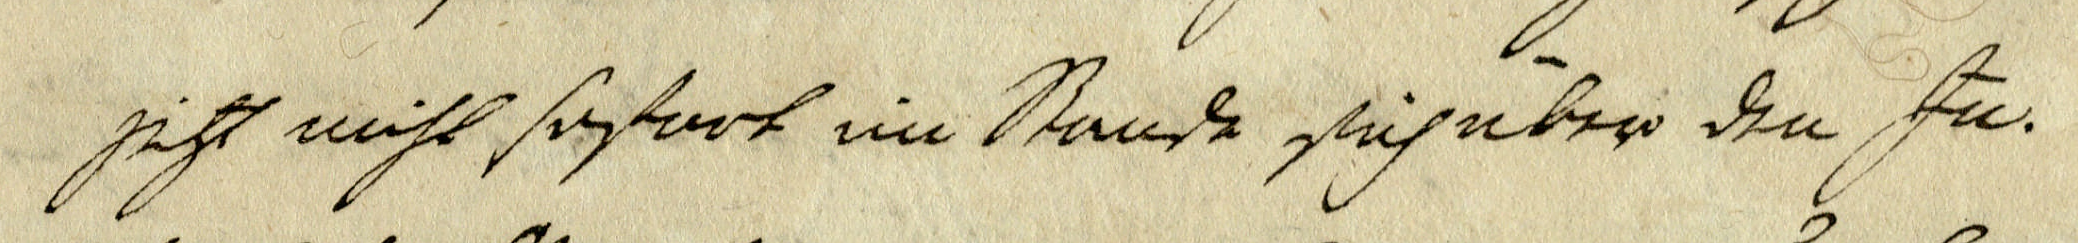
jetzt nicht sofort im Stande sich über den In¬
